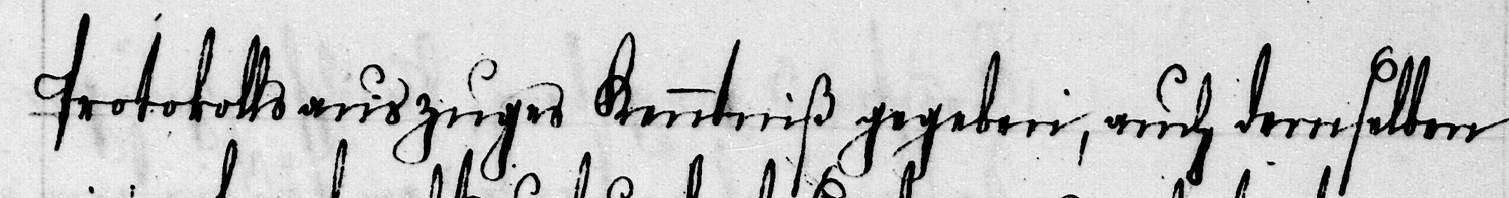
Protokollsauszuges Kenntniß gegeben, auch demselben
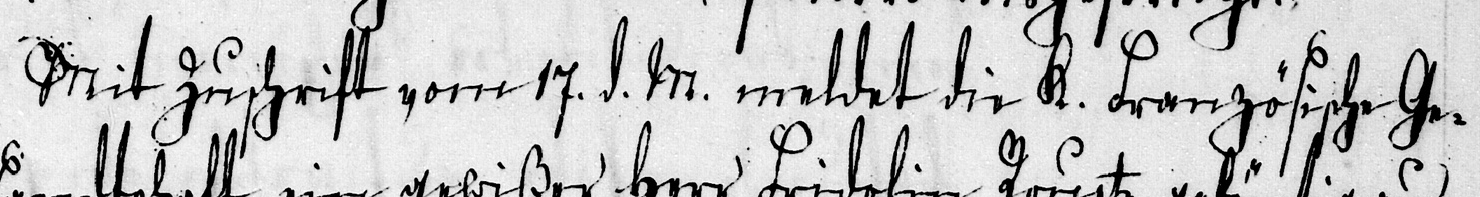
Mit Zuschrift vom 17. d. M. meldet die K. Französische Ge¬
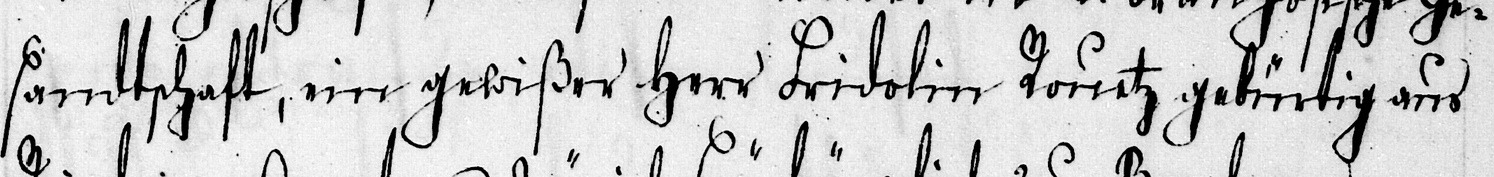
sandtschaft, ein gewißer Herr Fridolin Rouetz gebürtig aus
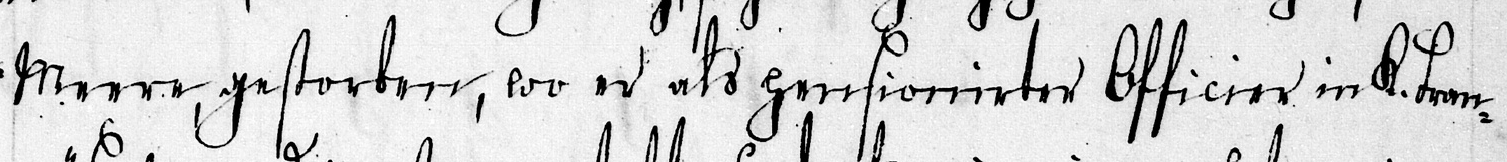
Meere, gestorben, wo er als pensionirter Officier in K. Fran¬
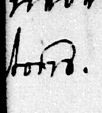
ons
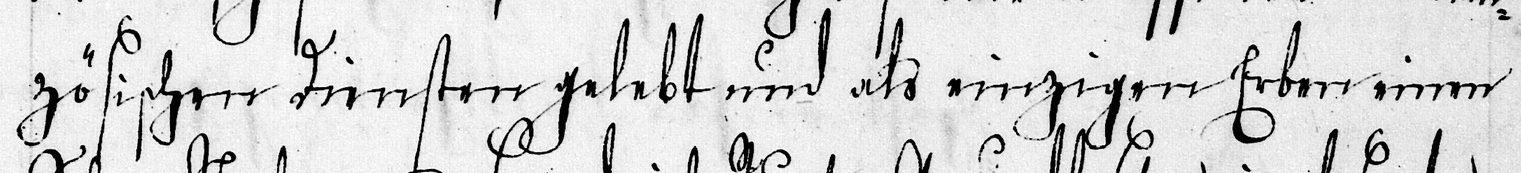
zösischen Diensten gelebt und als einzigen Erben einen
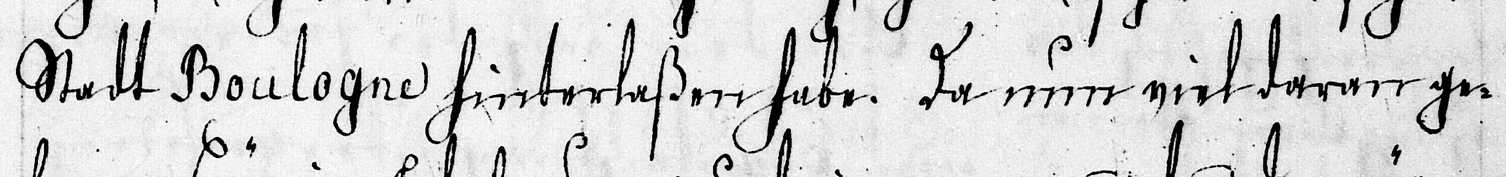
Stadt Boulogne hinterlaßen habe. Da nun viel daran ge¬
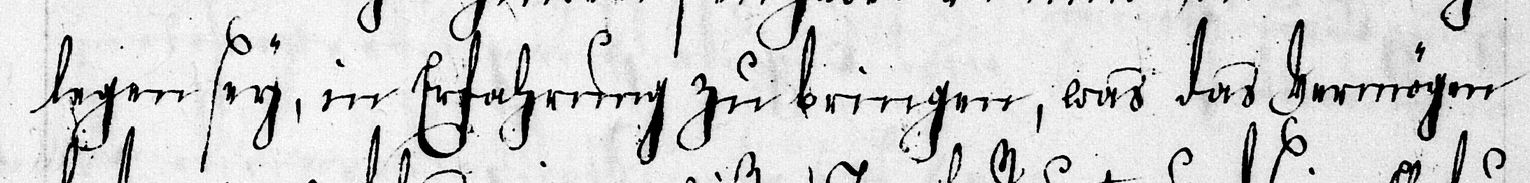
legen sey, in Erfahrung zu bringen, was das Vermögen
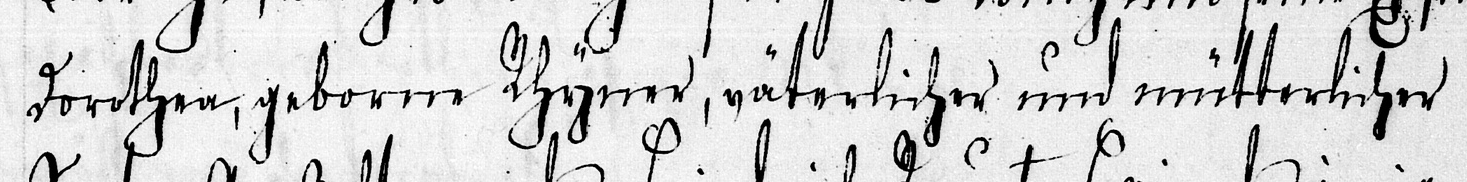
Dorothea, geborne Rhyner, väterlicher und mütterlicher
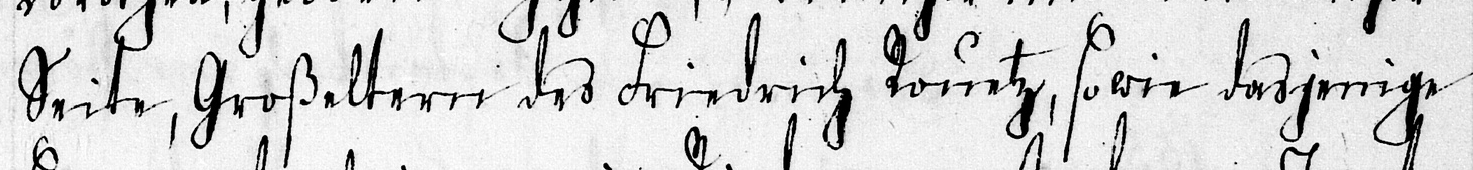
Seite, Großeltern des Friedrich Rouetz, sowie dasjenige
